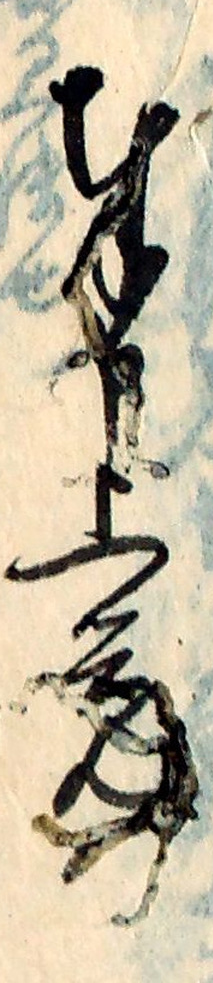奉申上覚
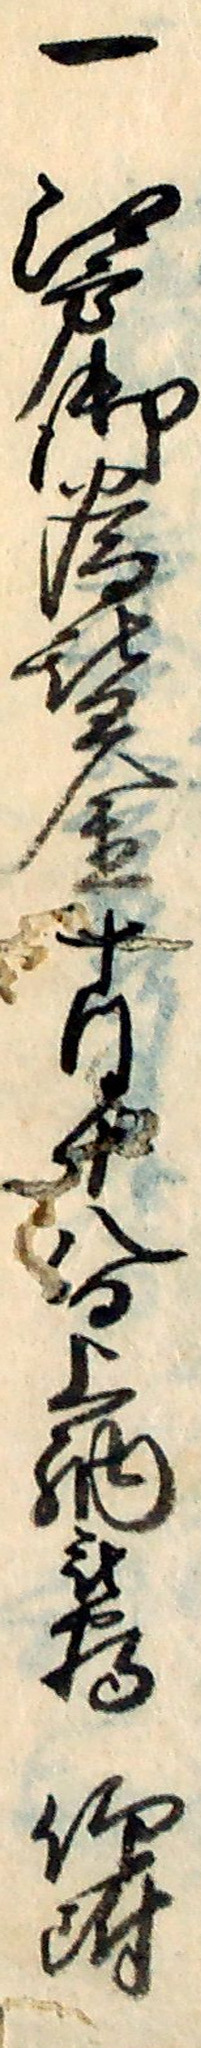一江戸御為替金十月十八日上納被為仰附
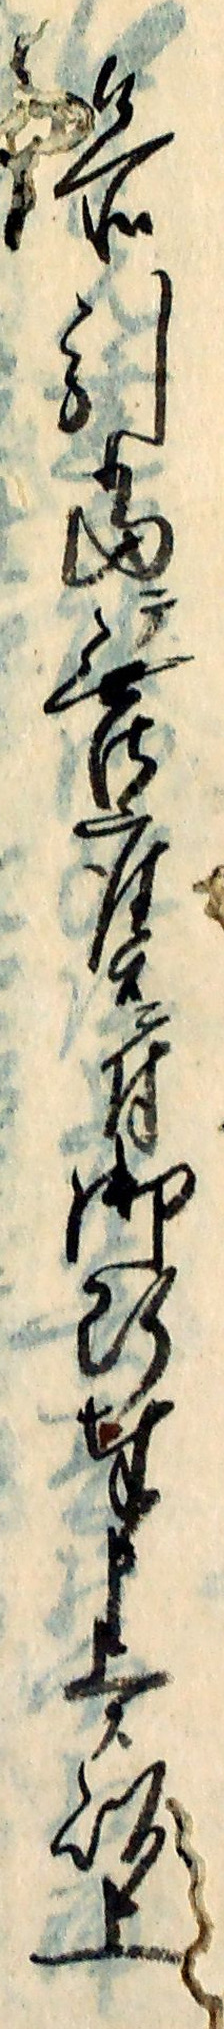候所引当て無御座候に付御断奉申上候以上
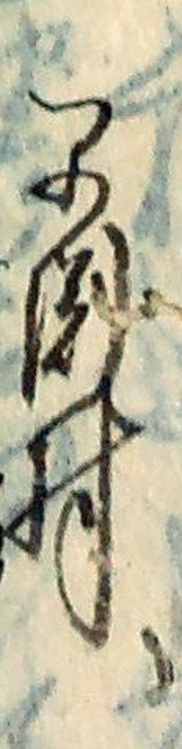早淵村
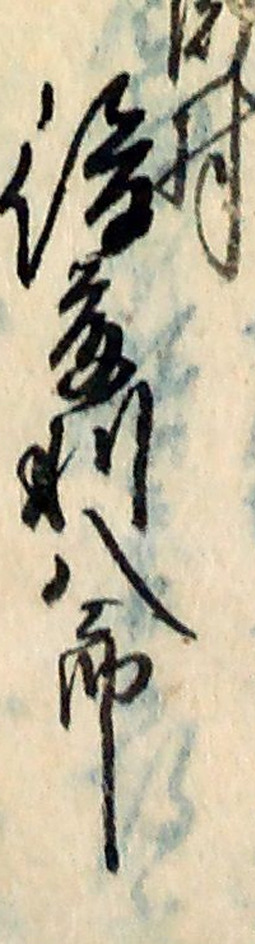後藤利八郎
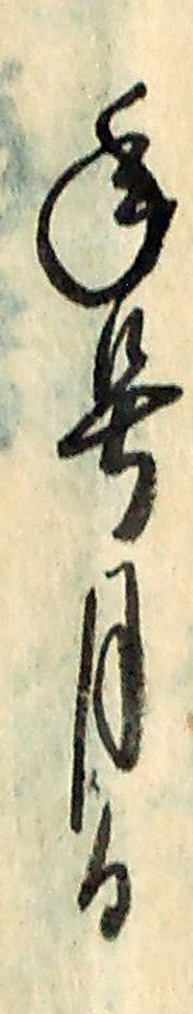年号月日
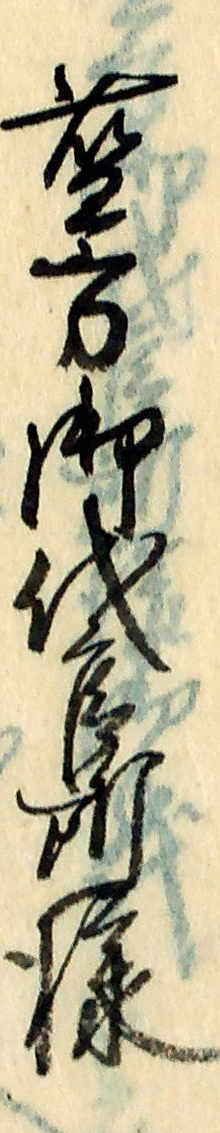藍方御代官所様

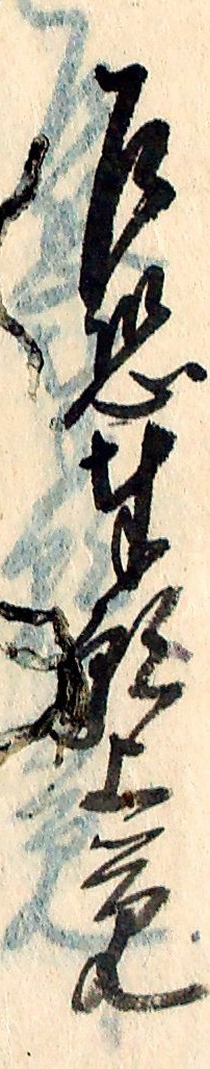乍恐奉願上覚
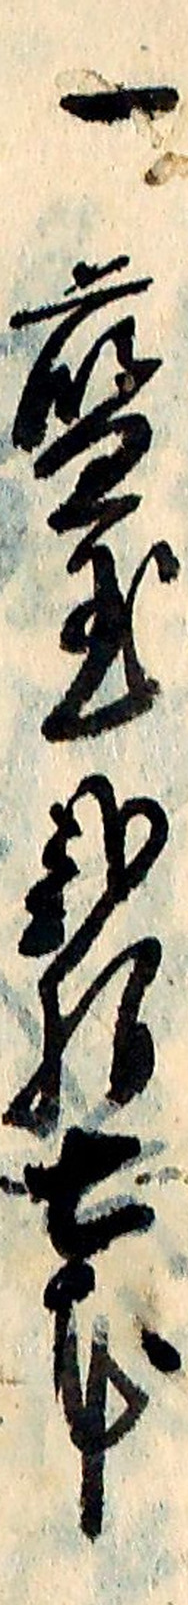一藍玉弐拾七本
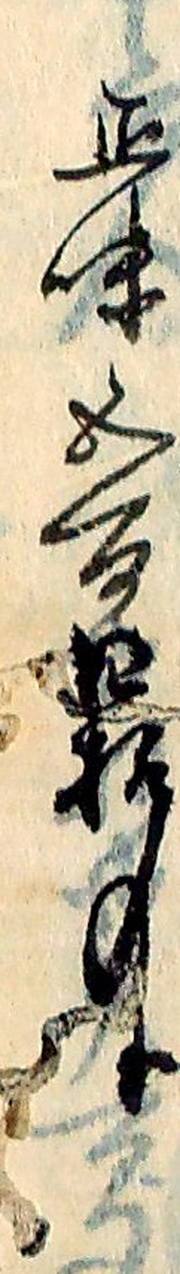正味五百四拾貫メ
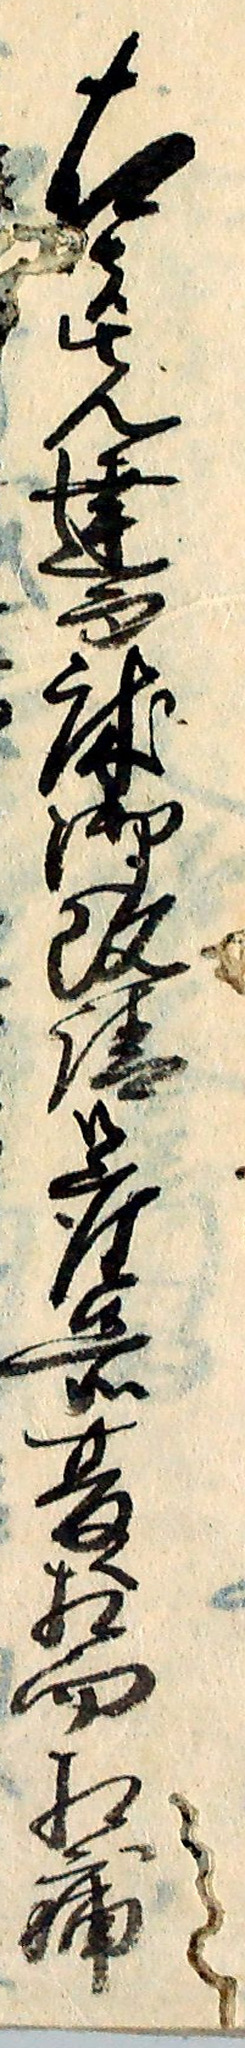右は先達て床御改請御座候所夏へ相向相痛
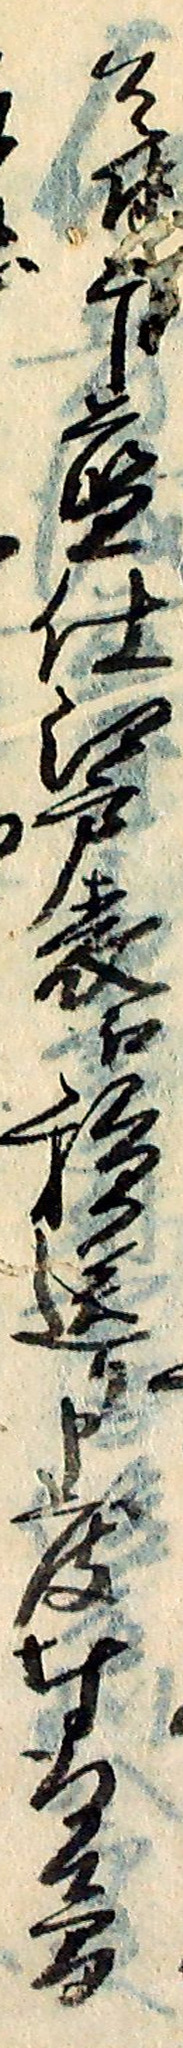候に付干藍仕江戸表え積送り申度奉存候間
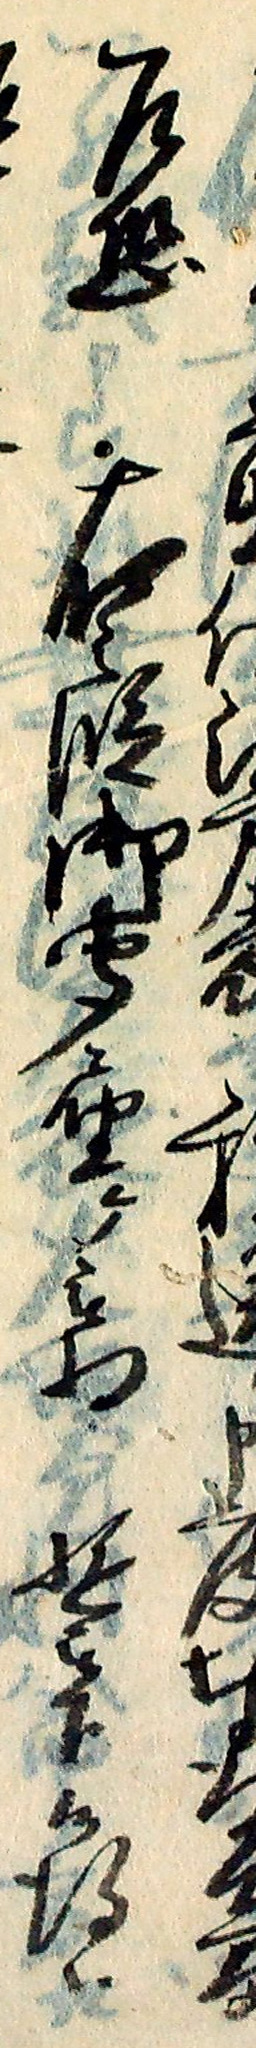乍恐右之段御聞届け被為遊被下候得は
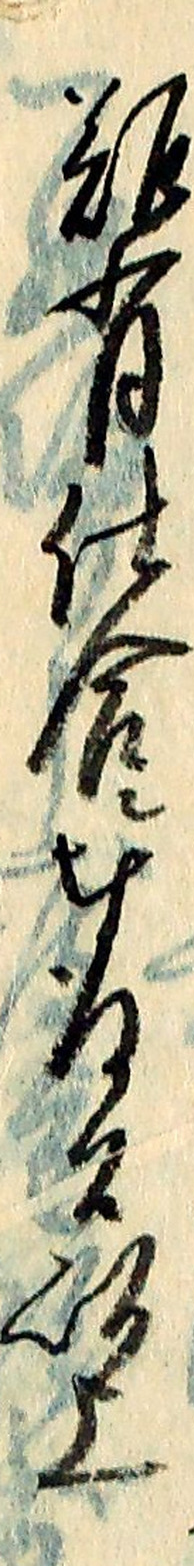難有仕合に奉存候以上
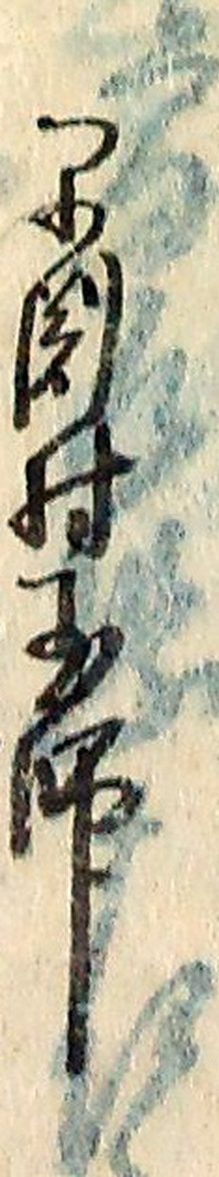早淵村玉師
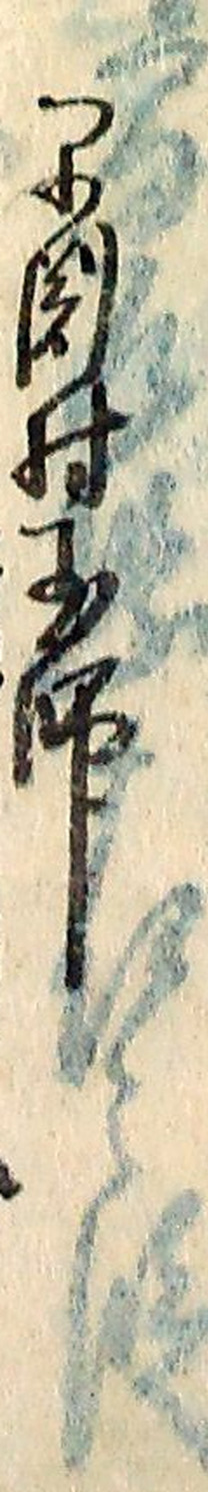早淵村玉師
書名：諸御願書控(後藤氏壱番）
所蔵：鳴門教育大学 Naruto University of Education
